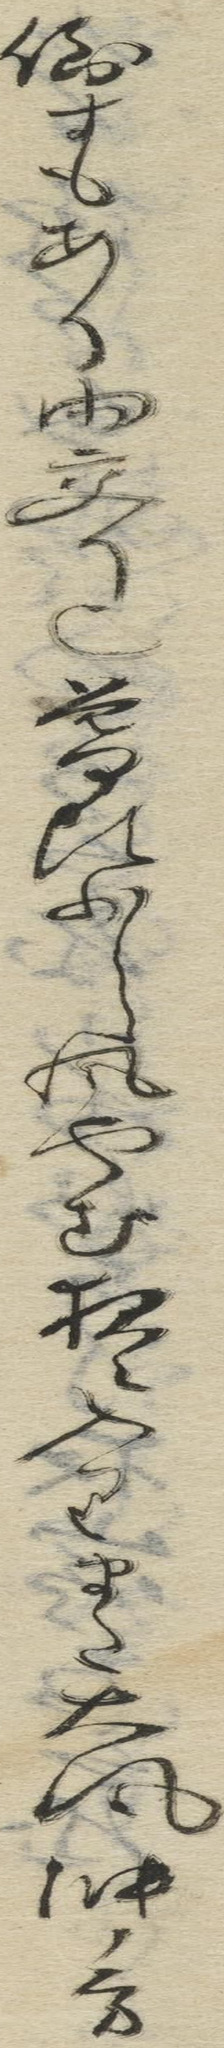倒すもあり雨交り也暮頃少し風やむ夜二入りまた大風沖ノ方
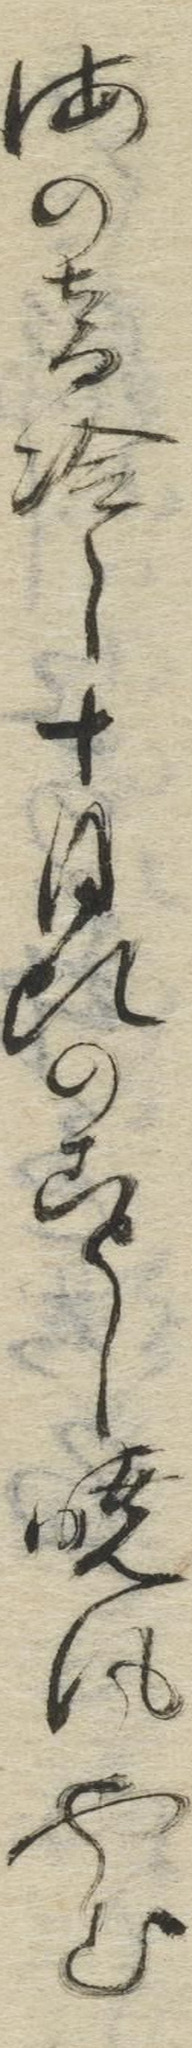海の音冷し十日頃のこし暁風やむ
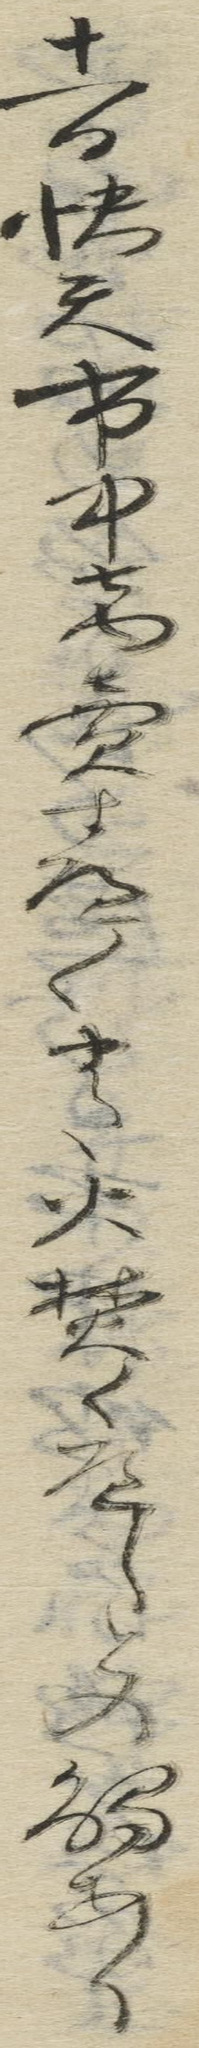十一日快天市中商売すへくまた火焚くへしとの触あり
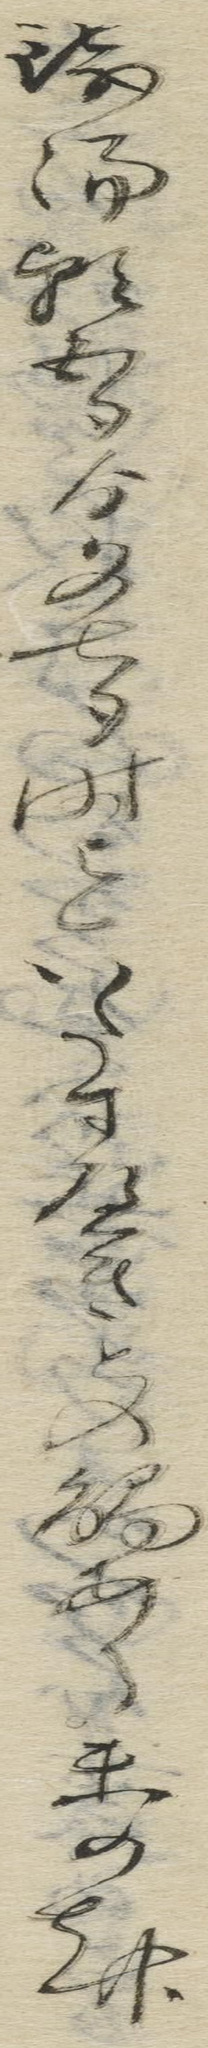銭湯朝五ツゟ夕七ツ時迄いたすへきとの触あり未の刻
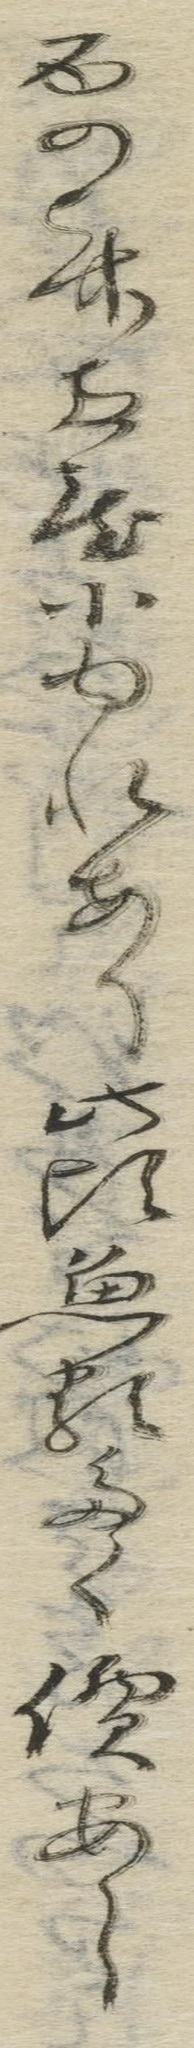酉の刻両度小ゆれあり此頃魚類多く価安し
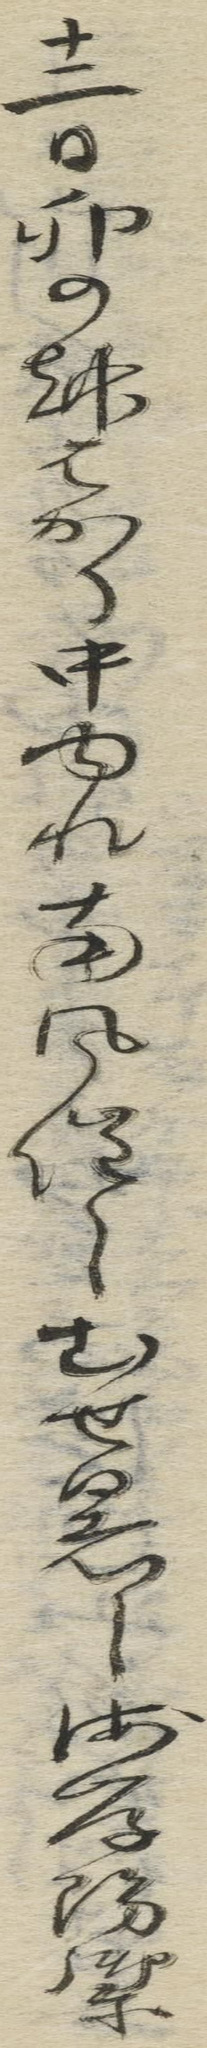十二日卯の刻はかり中ゆれ南風催しむせ暑し海岸防禦
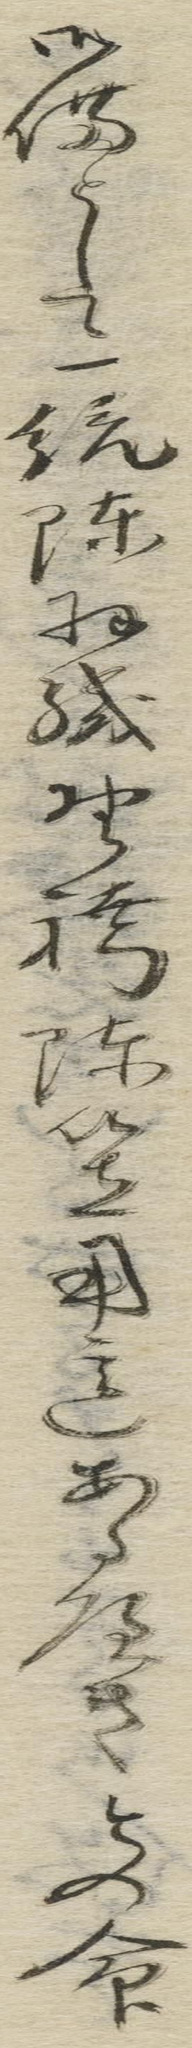御備として一統陣羽織野袴陣笠用意あるへきとの令
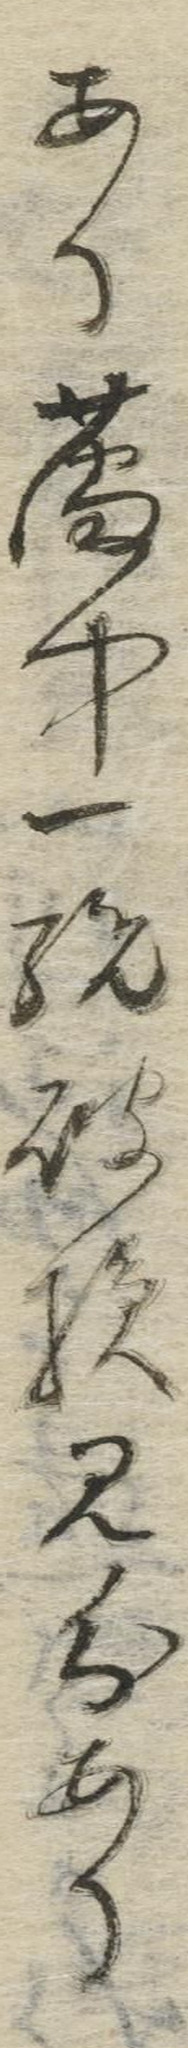あり藩中一統破損見分あり
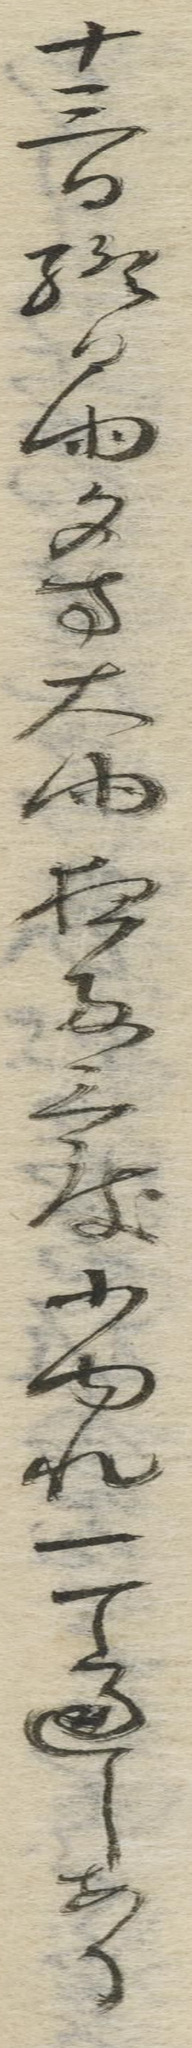十三日終日雨夕方大雨夜両三度小ゆれ一丁通しあり
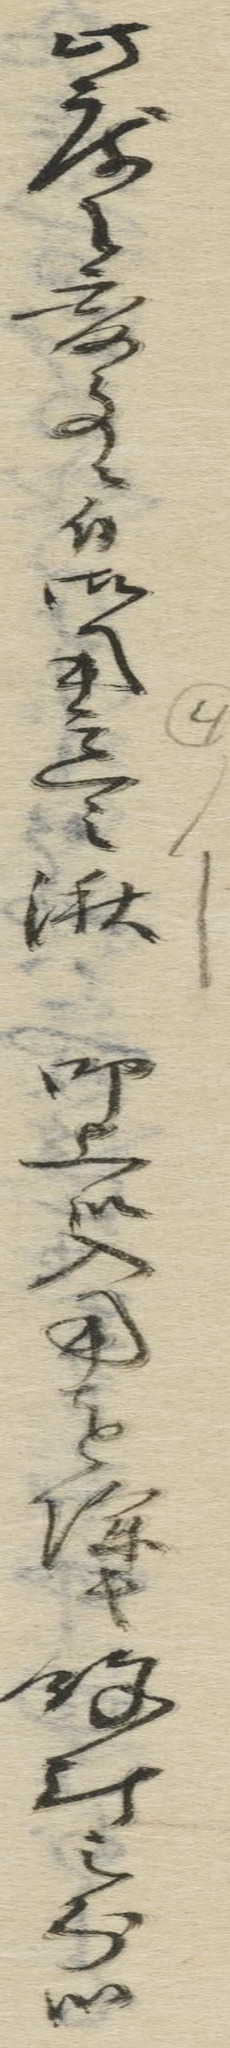此度之変事二付御用意之湫御上御入用を除キ餘計之分御
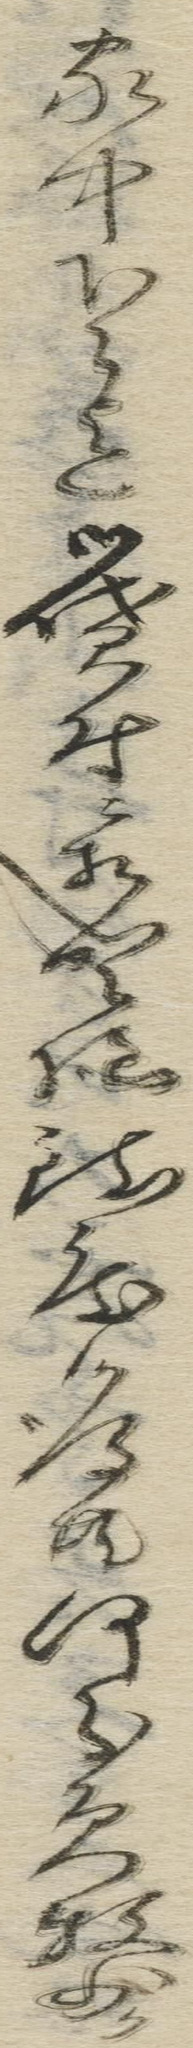家中下々迄御貸付二相成候様致度候得共何分員数少ク
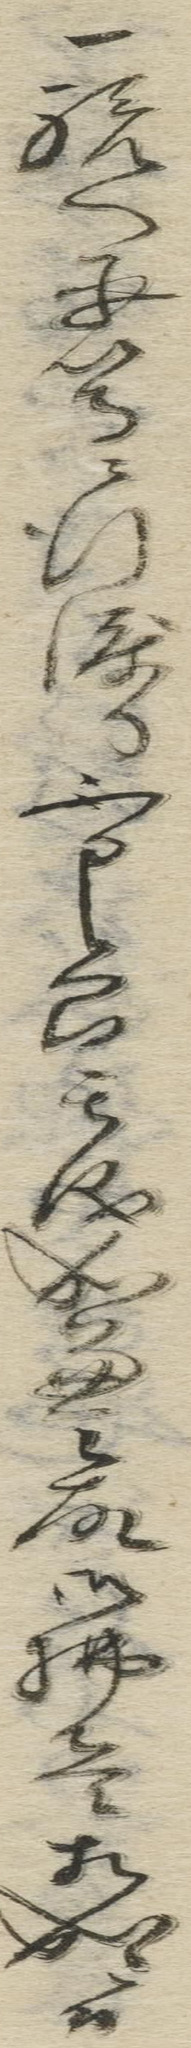一統へ平等二行渡り不申候間其儀成兼候故御払過二相成候二付
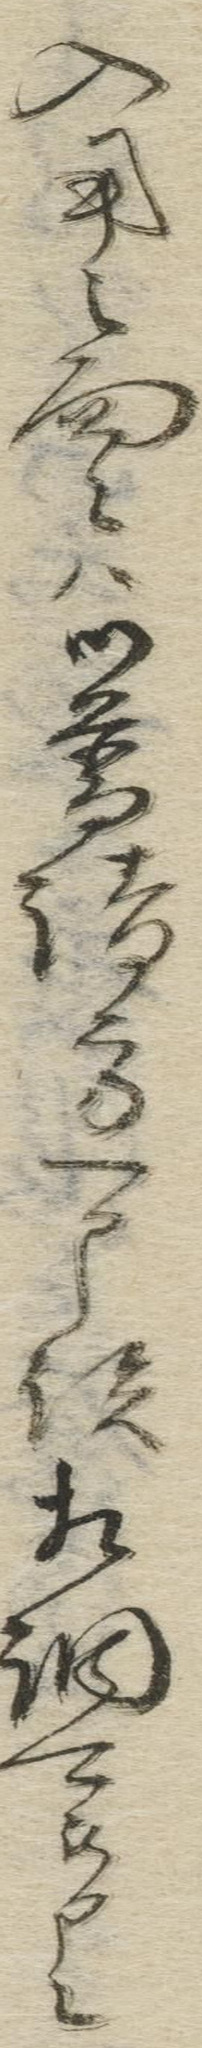入用之面々ハ御普請方へ申談相調可被申候
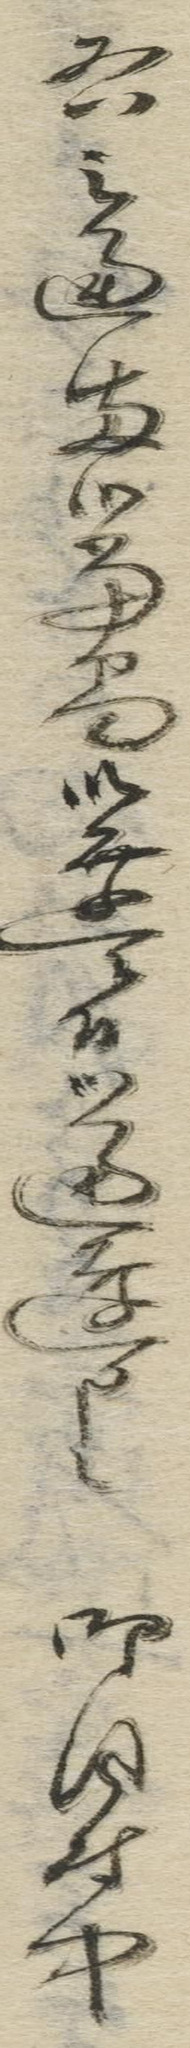右之通両御当番御達二付御通達申候御目付中
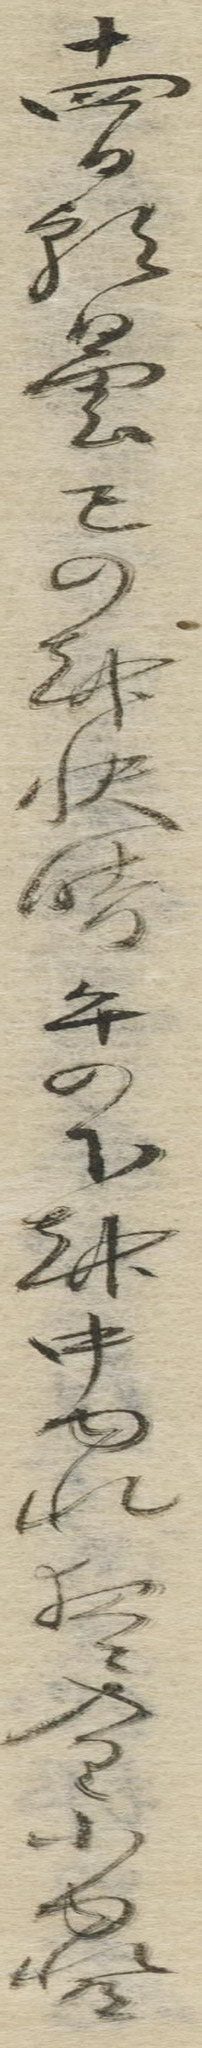十四日朝曇巳の刻快晴午の下刻中ゆれ夜二入り小ゆれ有
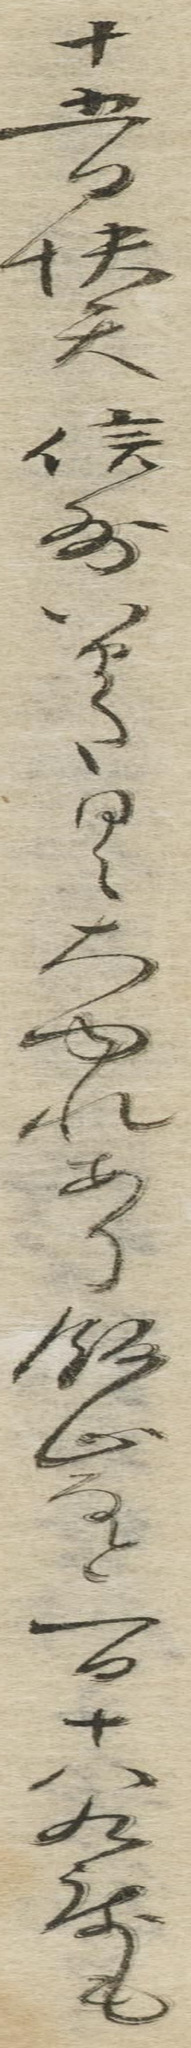十五日快天信州いまた日々大ゆれありいいやまなと一日十八九度も
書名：弘化丁未天變日記
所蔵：東京大学地震研究所図書室 Earthquake Research Institute Library, The University of Tokyo, JAPAN
